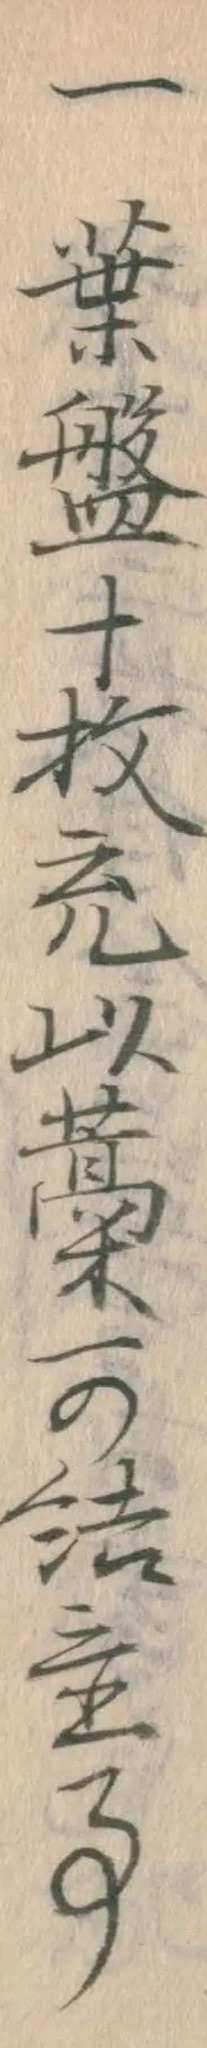一葉盤十枚充以藁可結置事
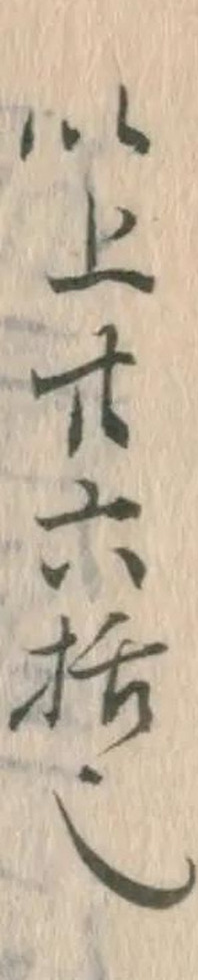以上廿六括也
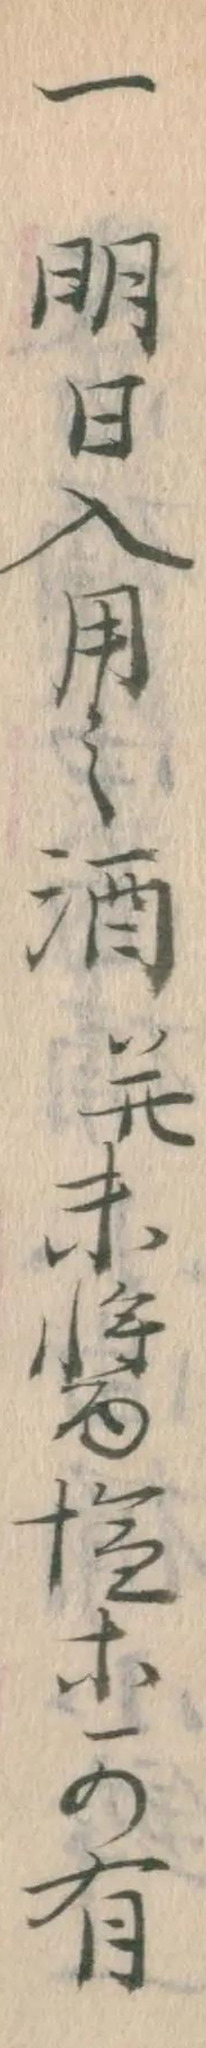一明日入用之酒并未醤塩等可有
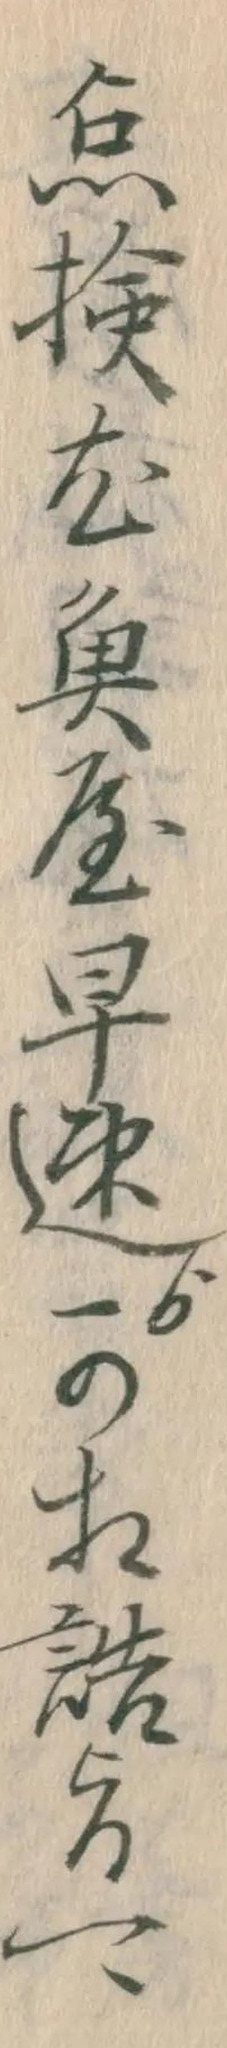点検尤魚屋早速ゟ可相詰旨可
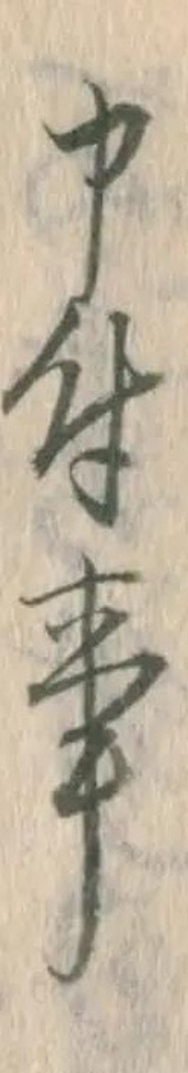申付事
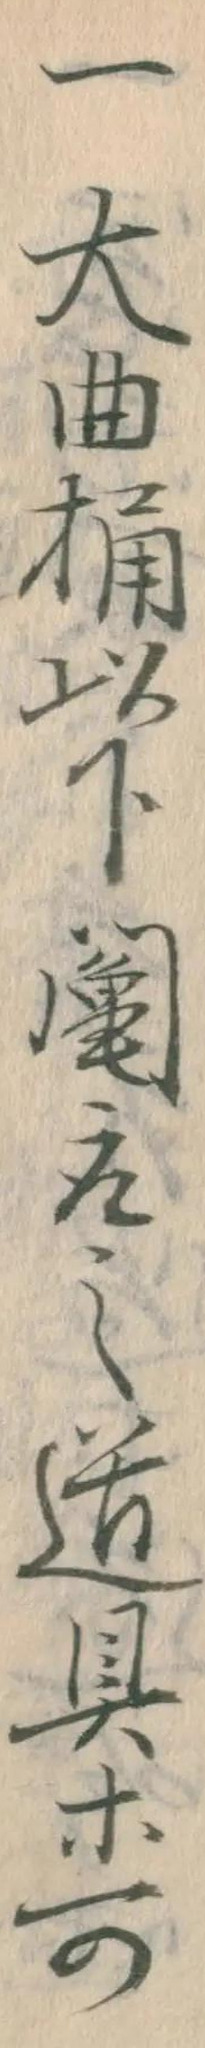一大曲桶以下鬮取之道具等可
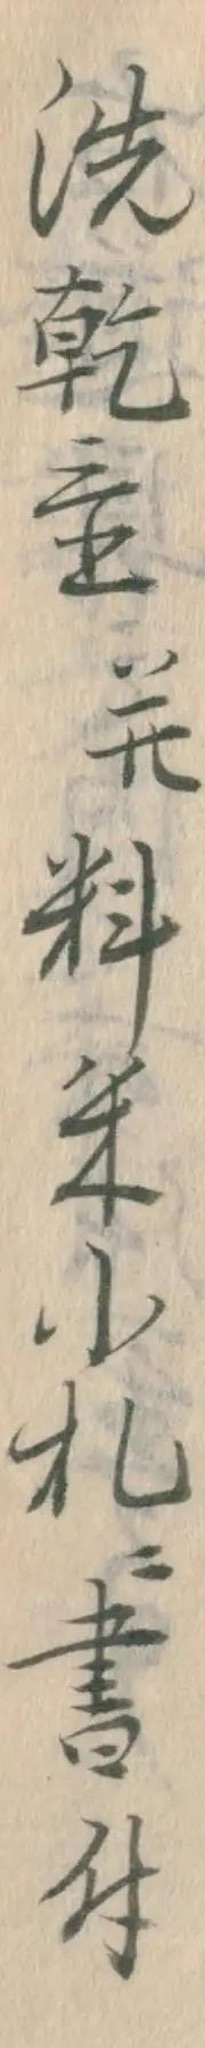洗乾置并料米小札に書付

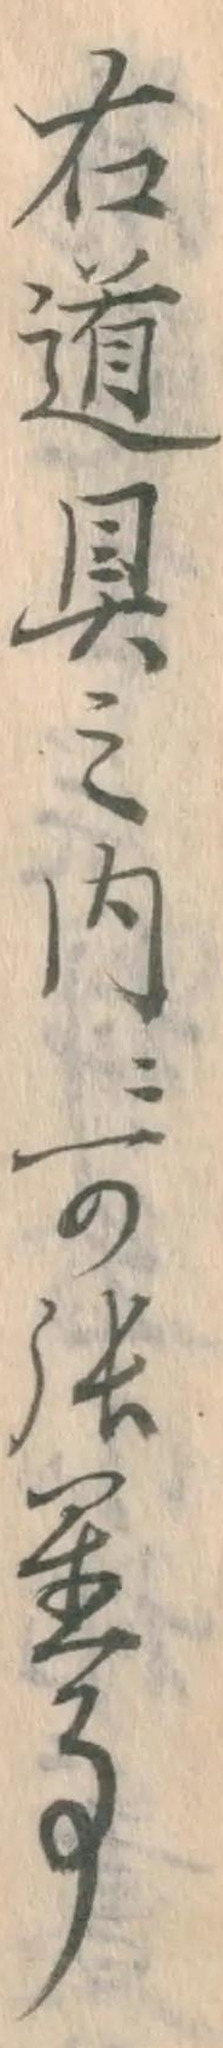右道具之内に可張置事
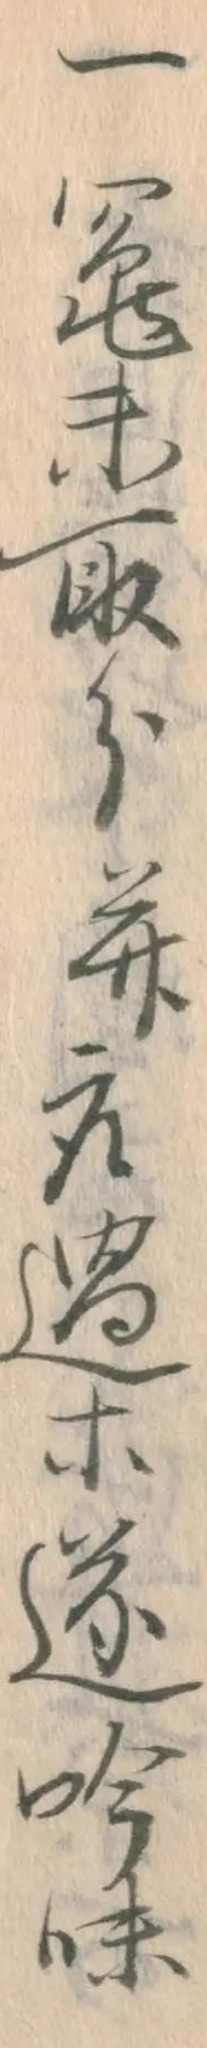一竃未取分并取過等遂吟味
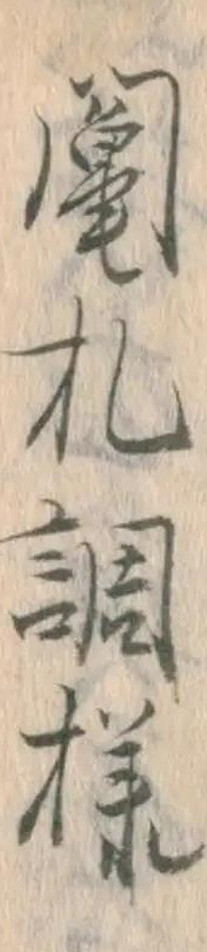鬮札調様
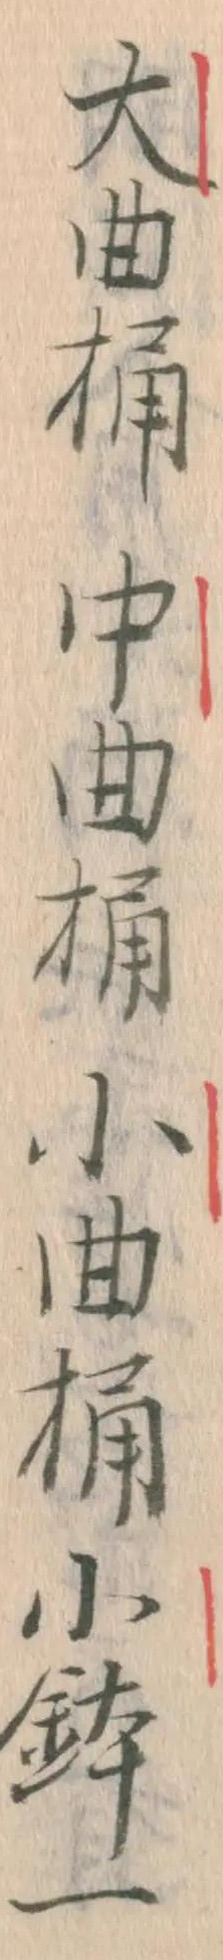大曲桶中曲桶小曲桶小鉢一
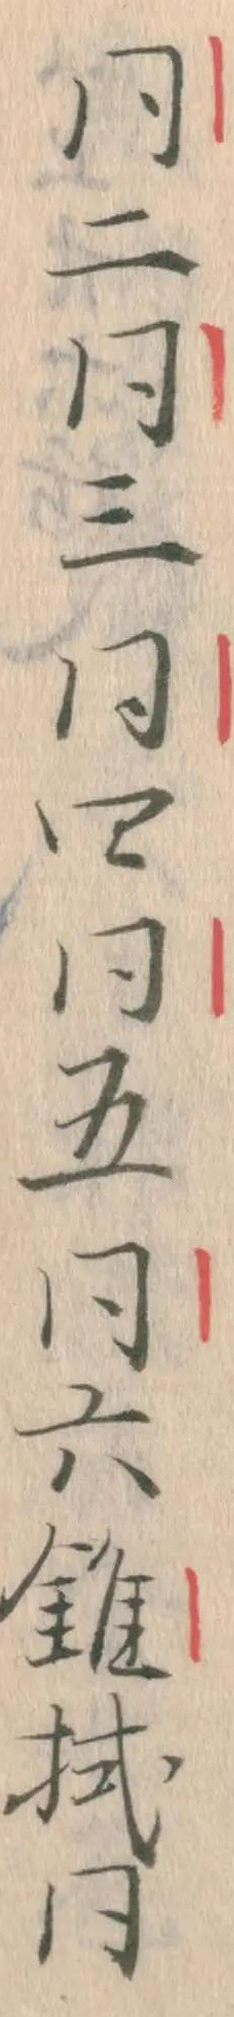同二同三同四同五同六錐拭同
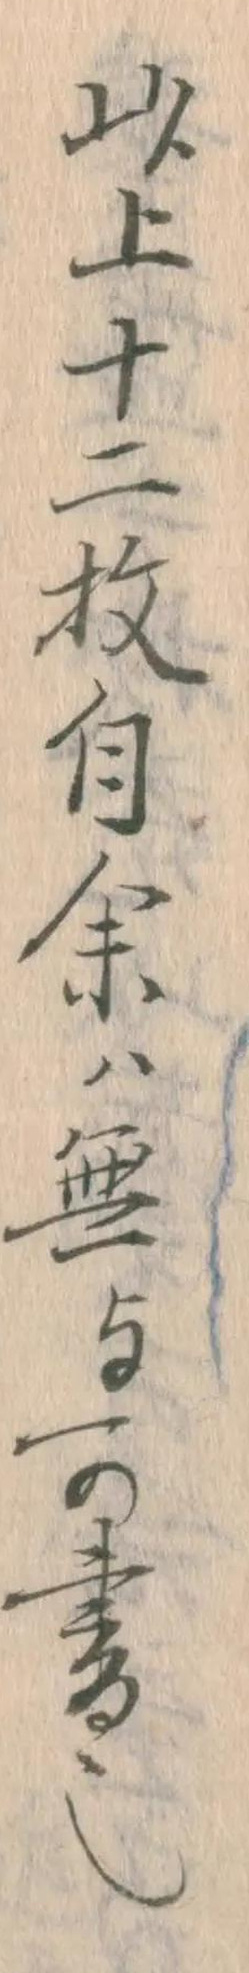以上十二枚自余は無与可書也
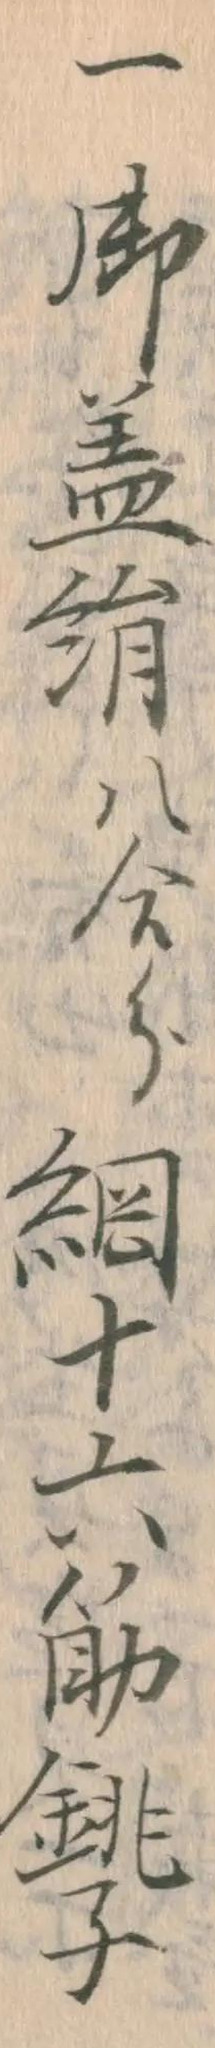一御蓋絹八合分綱十六筋銚子
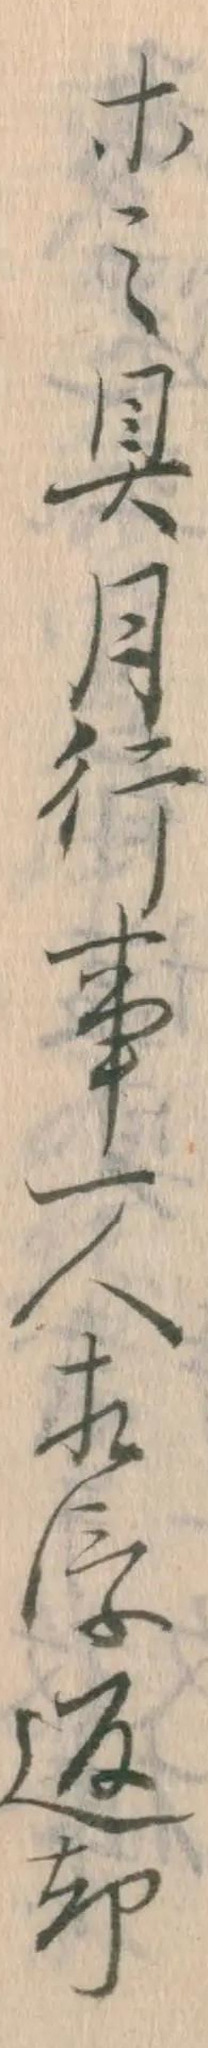等之具月行事一人相添返却
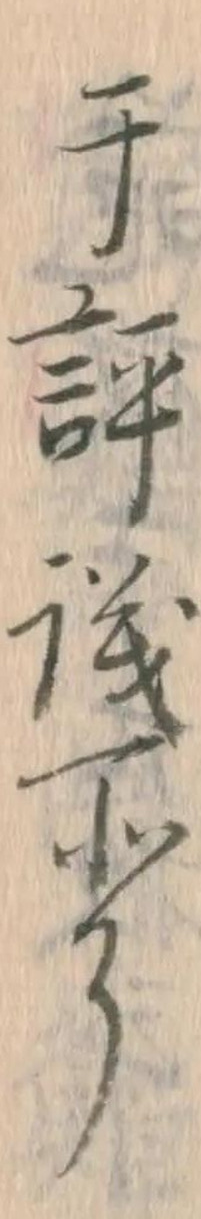于評議所了
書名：賀茂社記録. 第81冊
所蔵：国立国会図書館 National Diet Library, JAPAN
